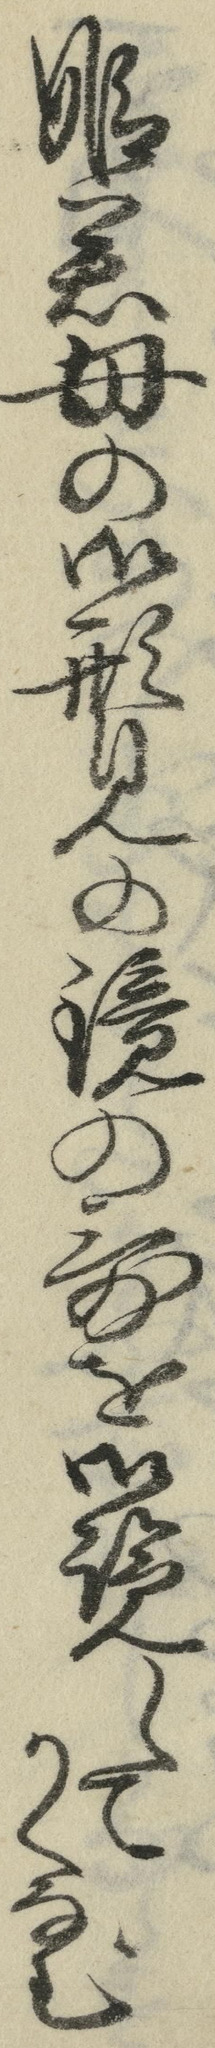姫君母の御形見の鏡の歌を御覧してかくなむ
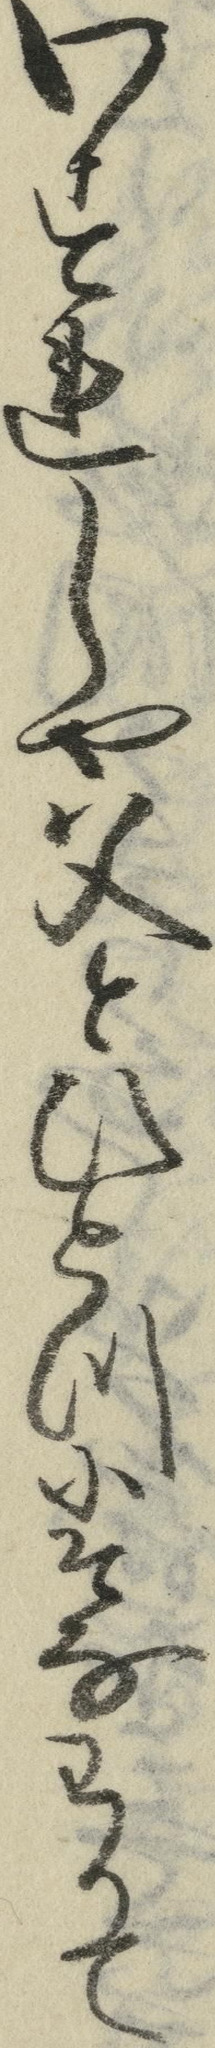わすれしや父とひとつにそなわりて
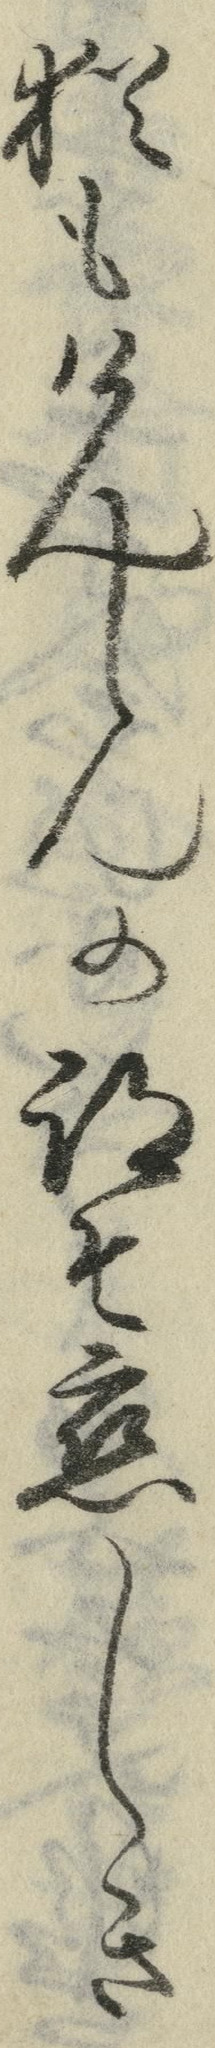猶もけんしんの跡そ恋しき
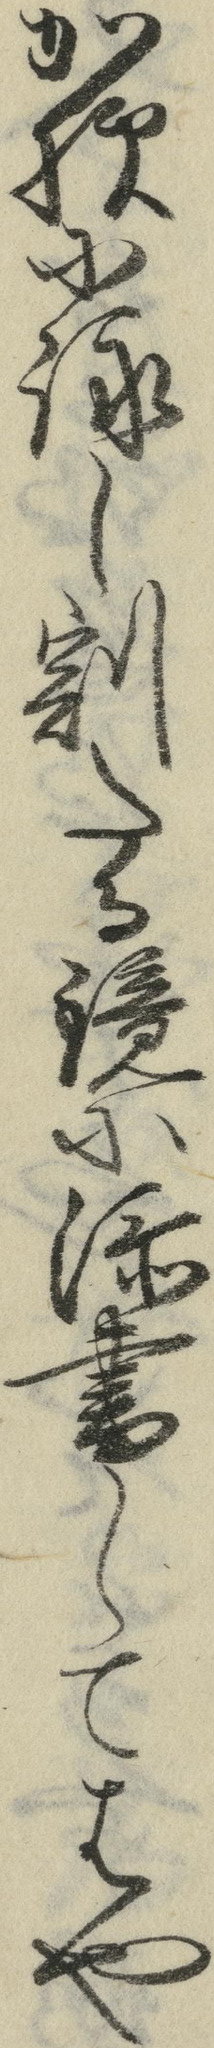か様に詠し割たる鏡に添書してはや
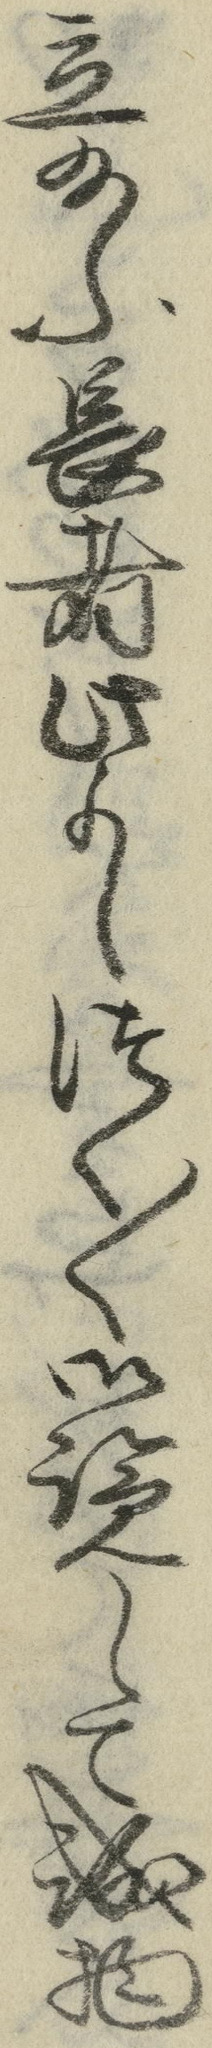立給ふ長者此よしつく〳〵御覧して誠物
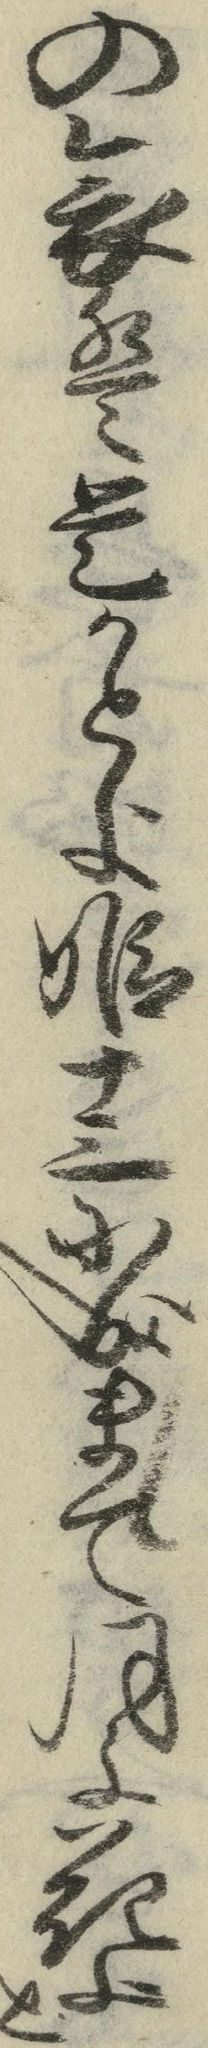の哀は是かとよ姫十三に成まて月よ花よと
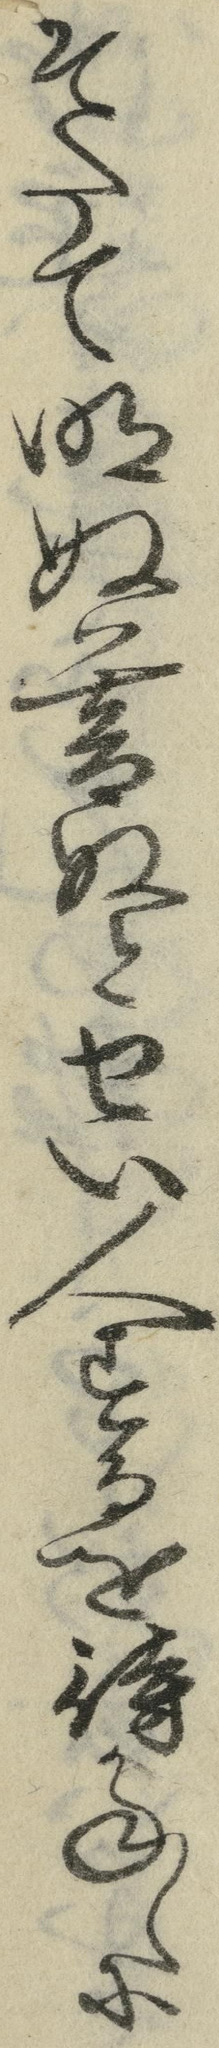そたて明ぬ暮ぬとせい人するを待かねしに
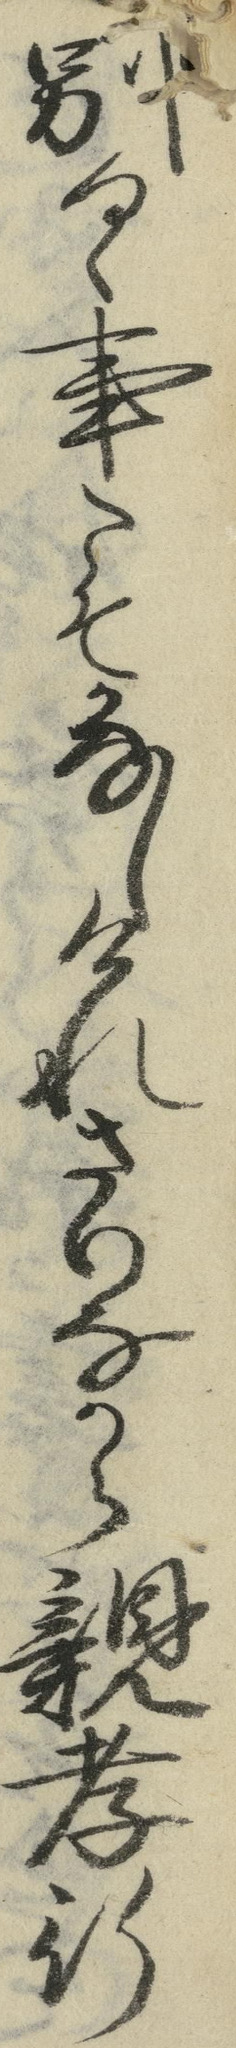別るゝ事こそかなしけれさりなから親孝行
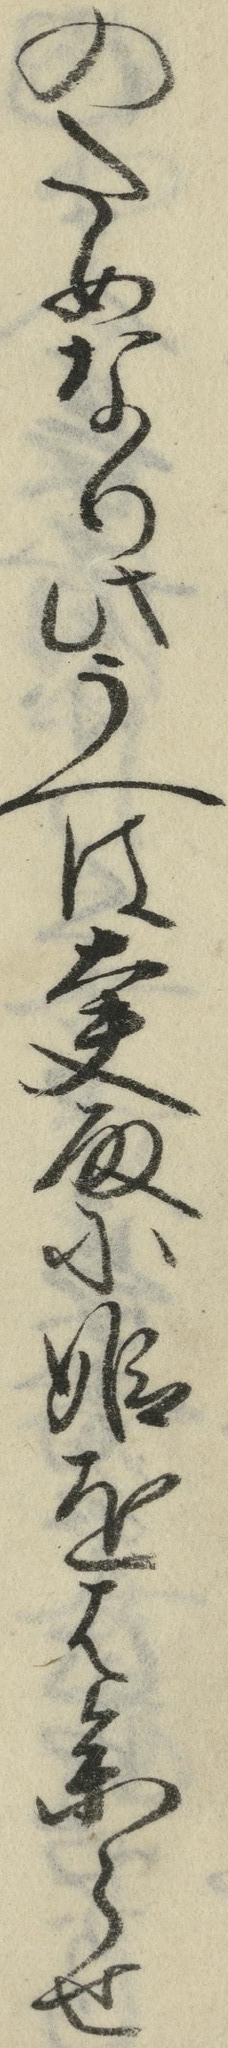のためなり此うへは大夫殿に姫をは参らせ
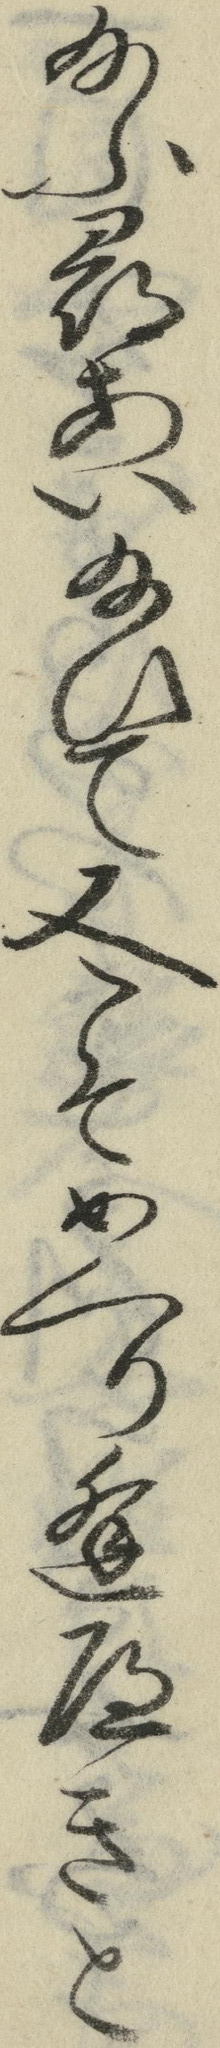給ふ尋あい給ひて又こそめくり逢へきと
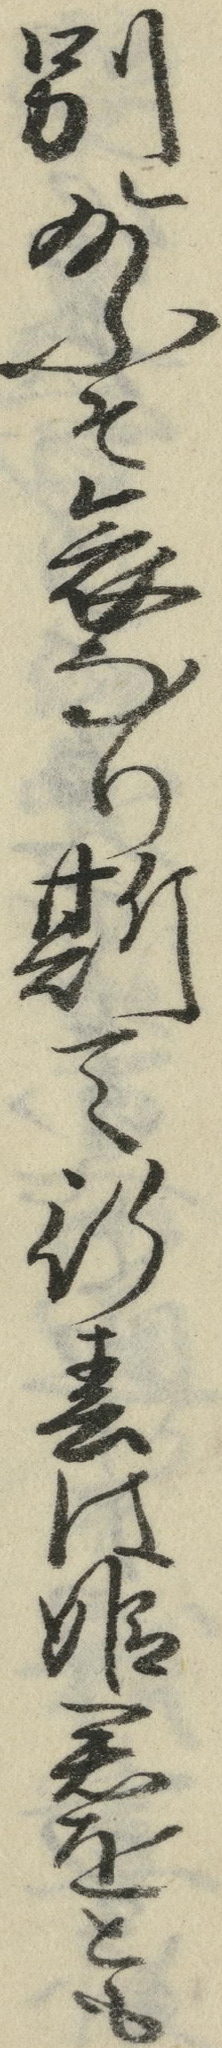別レ給ふそ哀なり斯て行春は姫君をとも
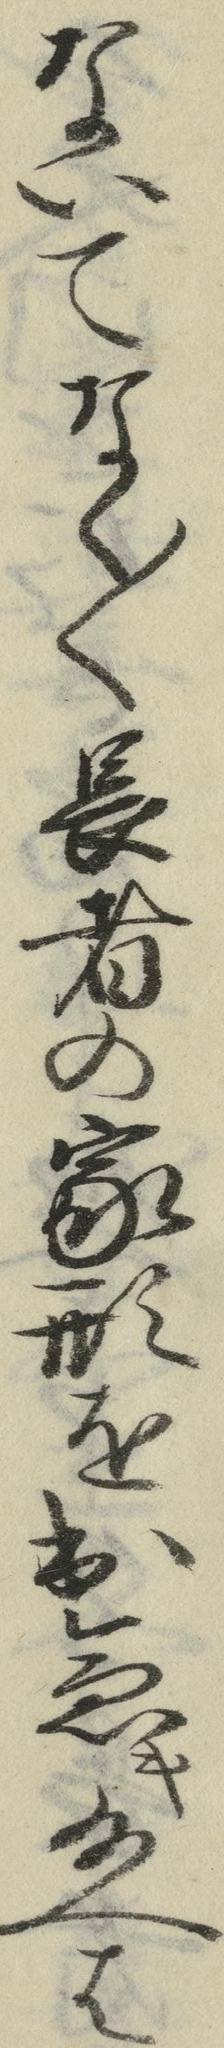ないてなく〳〵長者の家形を出急キ給へは
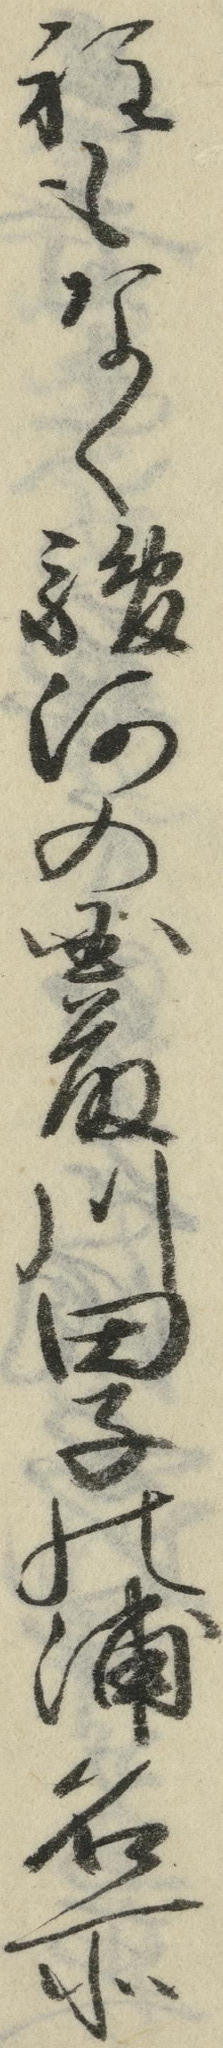程もなく駿河の国藤川田子の浦名所
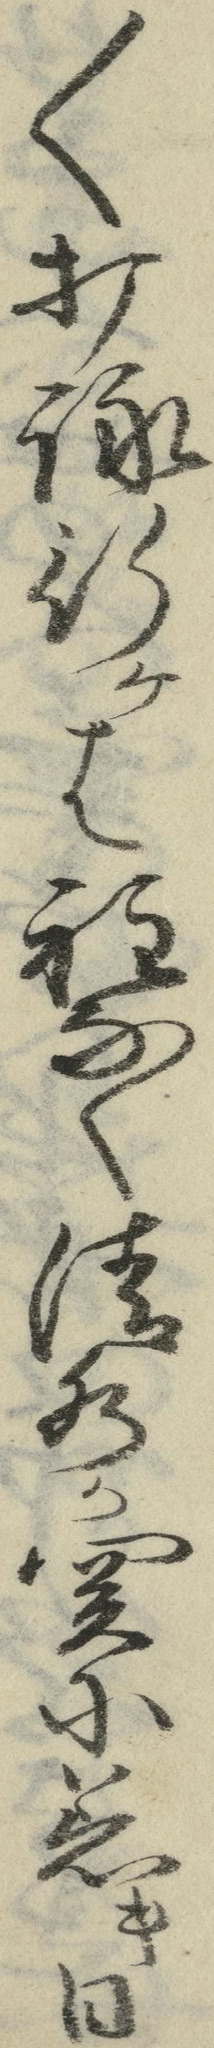〳〵打詠行ケは程なく清水か関に着キ日
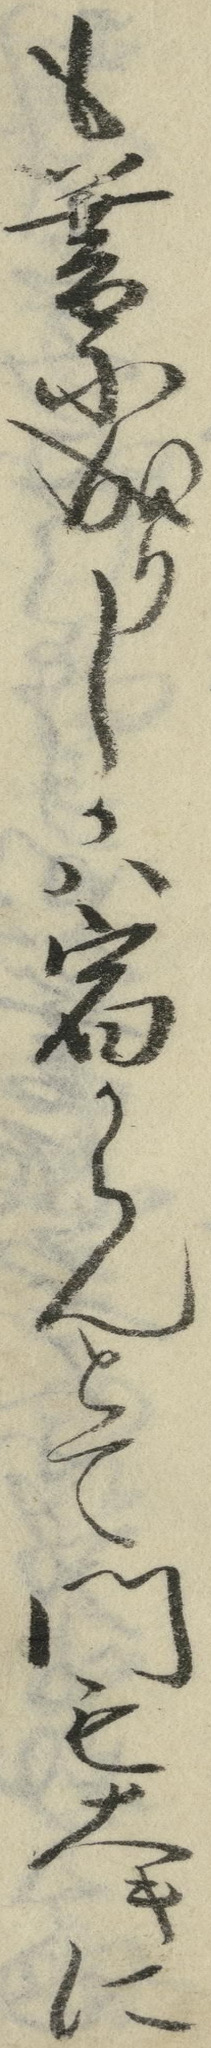も暮に成リしかハ宿からんとて門も大キに
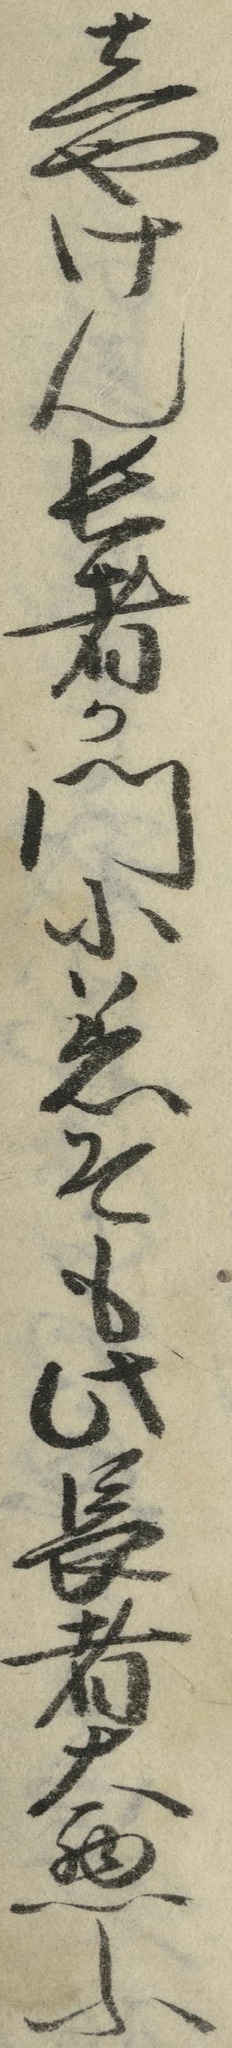しやけん長者か門に着そも此長者大悪ふ
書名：浅間記
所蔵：東京大学地震研究所図書室 Earthquake Research Institute Library, The University of Tokyo, JAPAN
